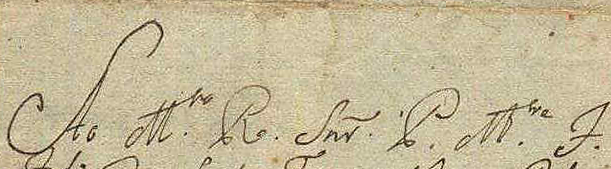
Ao M.to R. Snr̄. P.e M.tre F.
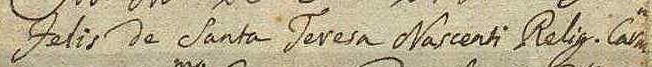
Felis de Santa Teresa Nascenti Relig. Carm
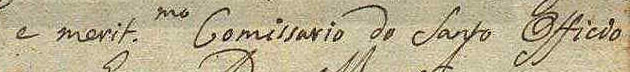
e merit.mo Comissario do Santo Officio
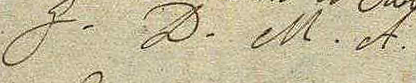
G. D. M. A.
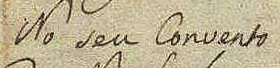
No seu Convento
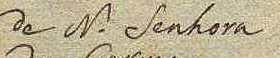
de N. Senhora
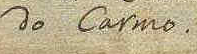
do Carmo.
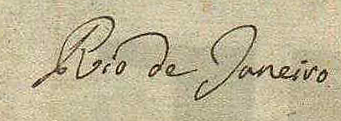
Rio de Janeiro
